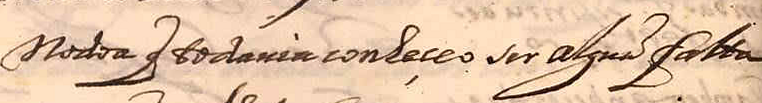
Nodoa q̄ todauia conheceo ser alguā falta
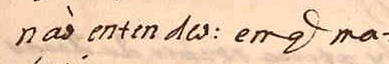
naõ entendeo: em q̄ ma
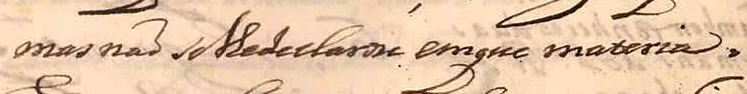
mas não se lhe declarou em que materia.
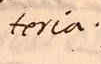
teria.
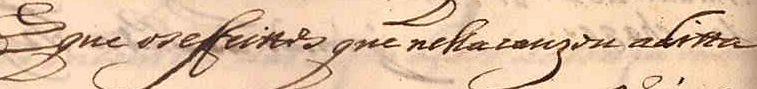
E que os effeitos que nella cauzou a ditta
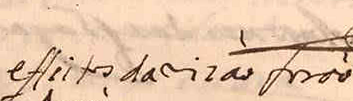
effeitos da vizão foraõ
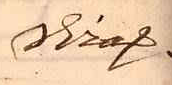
Vizaõ.
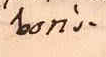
bons.
